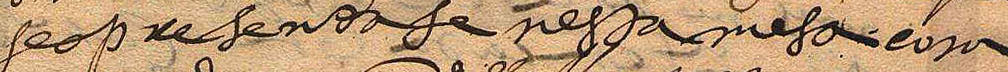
se apresentase nesta mesa com
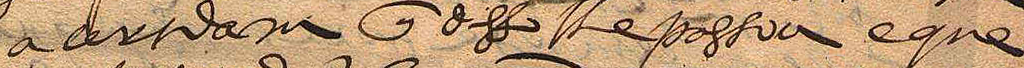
a certidam q̄ disso lhe passou e que
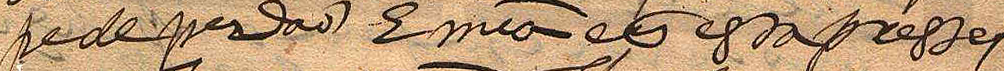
pede perdaõ E mīa e q̄ esta prestes
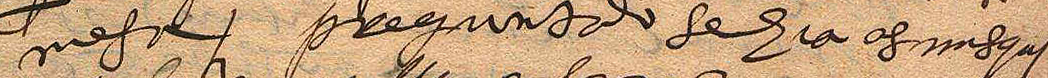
mesa / preguntado se hia as mesquj
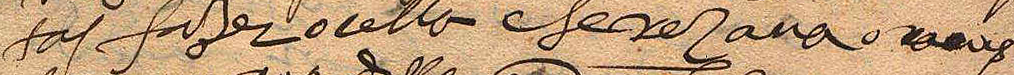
tas fazer o cella e se rezaua oraçois
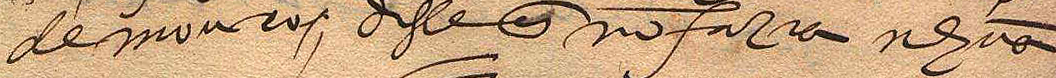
de mouros; disse q̄ nō fazia nhūa
